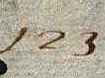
123
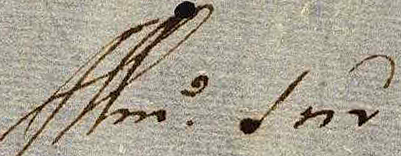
Jllm.o Snr̄
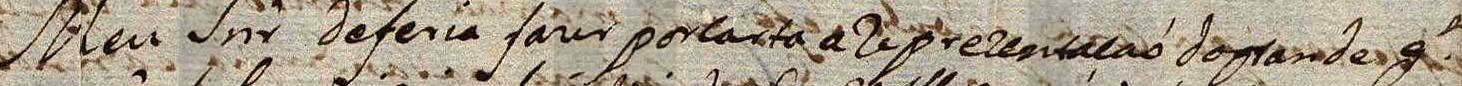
Meu snr̄ deferia fazer por carta a Reprezentaçaõ do grande g.to
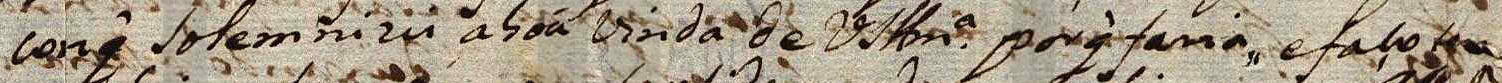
con q̄ solemnizei a boa vinda de V Illm.a porq̄ faria, e faço ten
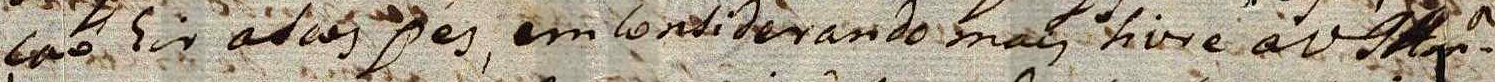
çaõ hir a seos pés, em considerando mais livre a V lllm.a
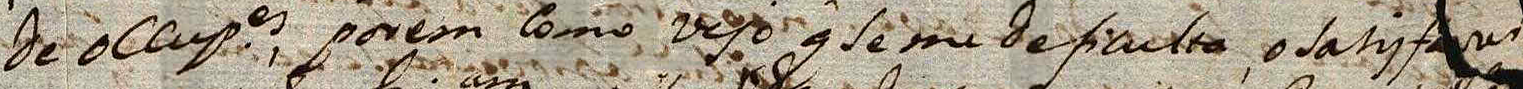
de occup.es, porem como vejo q̄ se me deficulta, o satisfazer
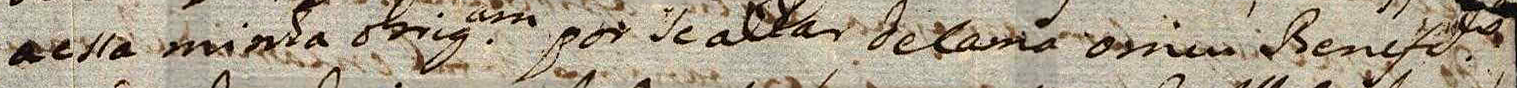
a essa minha obrig.am por se achar de cama o meu Benefd.o
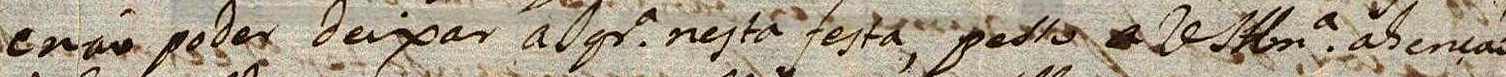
e naõ poder deixar a Igr.a nesta festa, pesso a V Illm.a a bençaõ
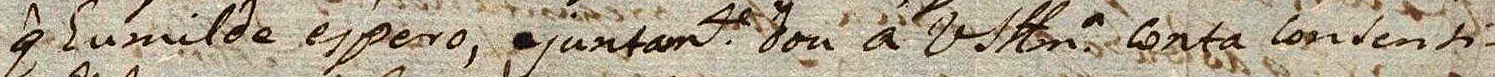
q̄ humilde espero, e juntam.te dou a V Illm.a conta consenti
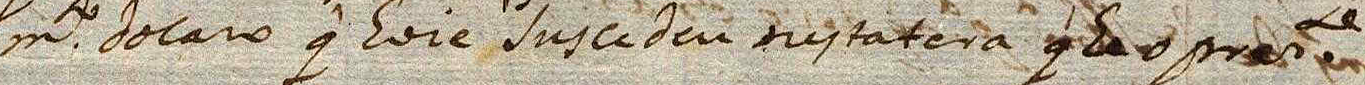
m.to do cazo q̄ hoie suscedeu nesta tera q̄ he o prez.te
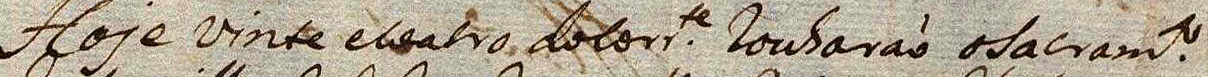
Hoje vinte e coatro do corr.te Roubaraõ o sacram.to
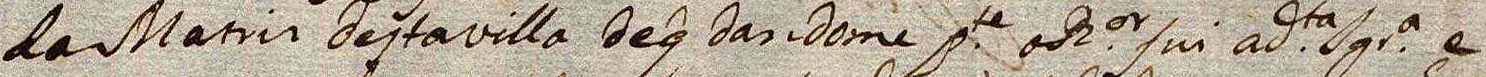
da Matriz desta villa de q̄ dandome p.te o R.or fui a d.ta Igr.a e
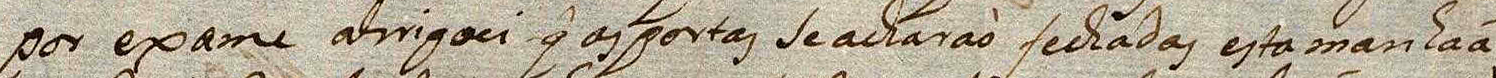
por exame aberigoei q̄ as portas se acharaõ fechadas esta manhaã,
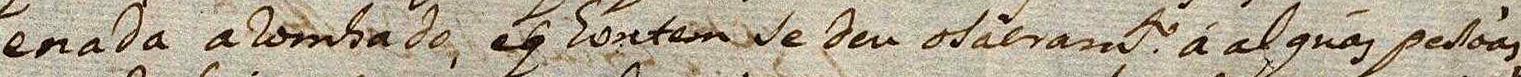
e nada aRombado, e q hontem se deu o sacram.to á alguās pesoas,
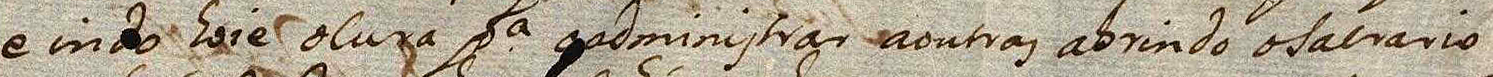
e indo hoie o cura p.a a administrar a outros abrindo o sacrario
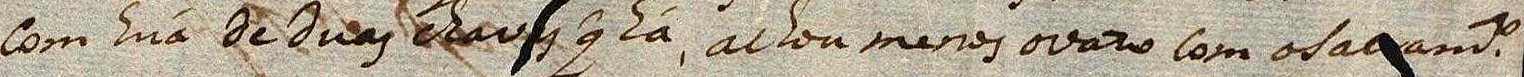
com huā de duas chaves q̄ há, achou menos o vazo com o sacram.to
